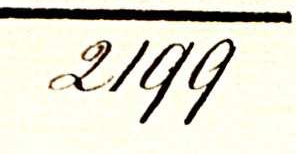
2199
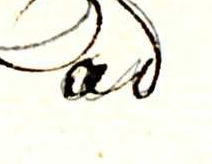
ad
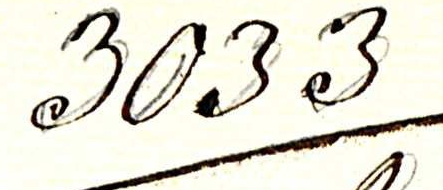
3033
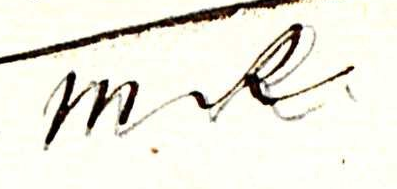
M R
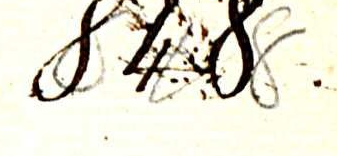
848
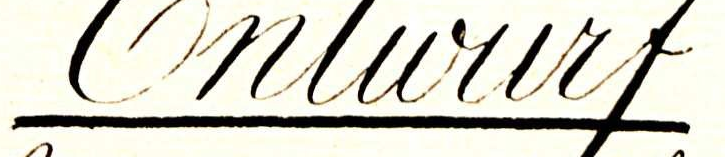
Entwurf
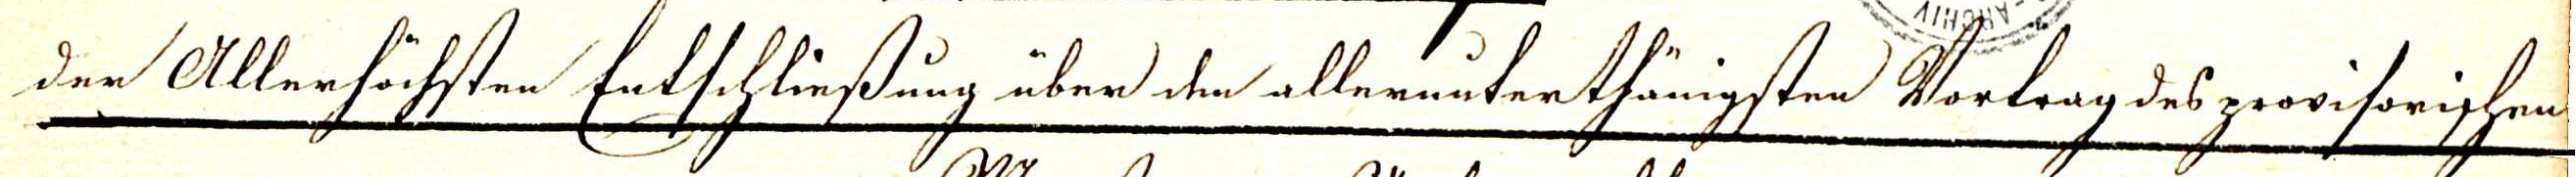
Der Allerhöchsten Entschließung über den allerunterthänigsten Vortrag des provisorischen
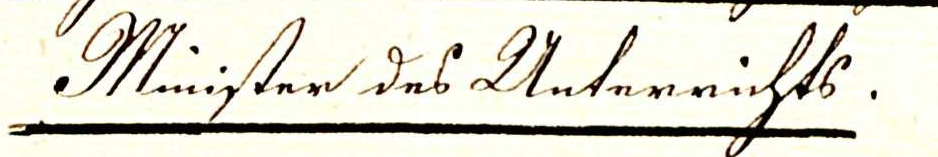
Minister des Unterrichts.
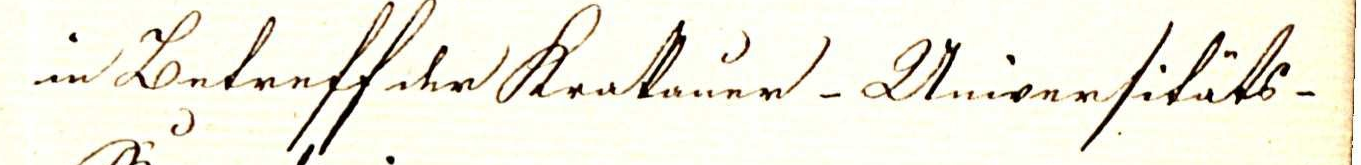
in Betreff der Krakauer - Universitäts-
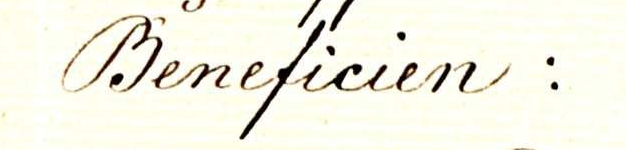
Beneficien:
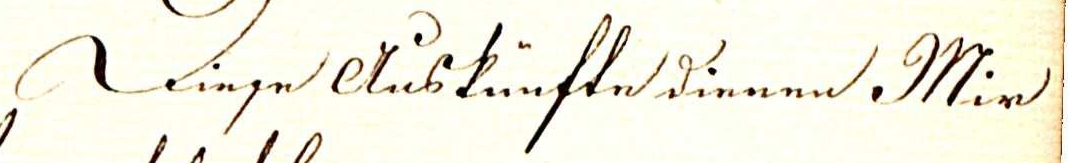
Diese Auskünfte dienen Mir
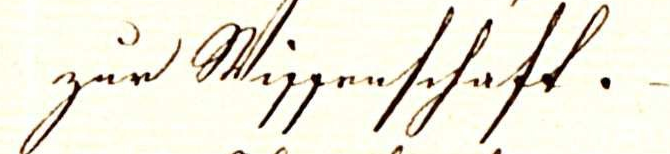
zur Wissenschaft.
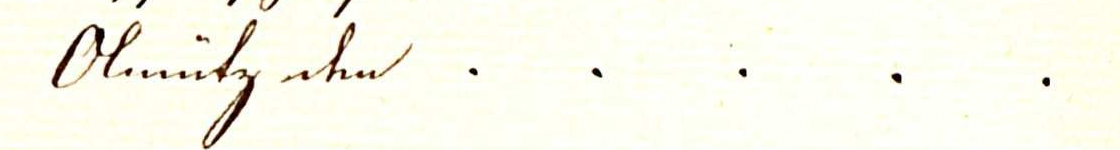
Olmütz den .....
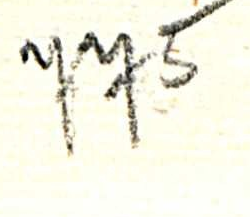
775
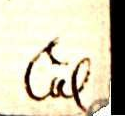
Cal
